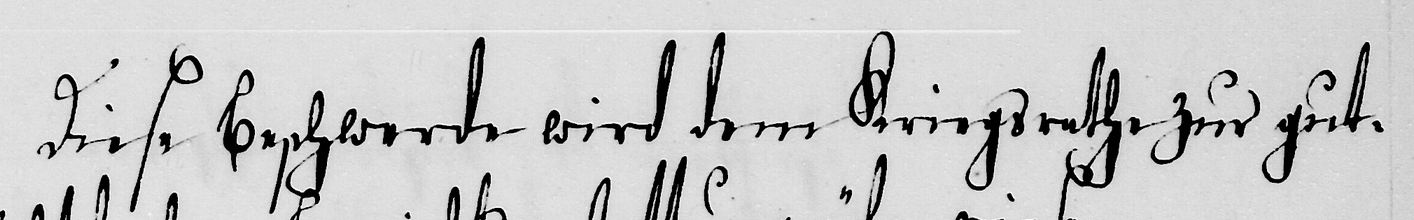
Diese Beschwerde wird dem Kriegsrathe zur gut¬
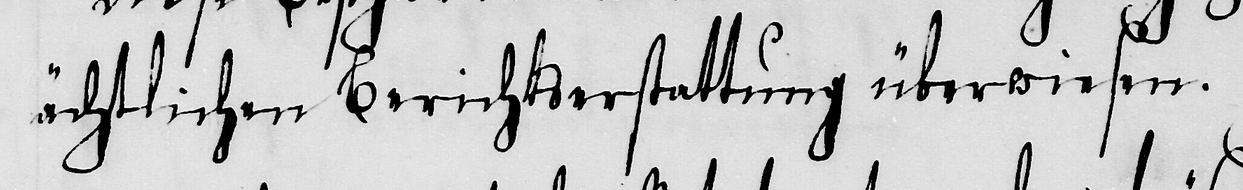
ächtlichen Berichtserstattung überwiesen.
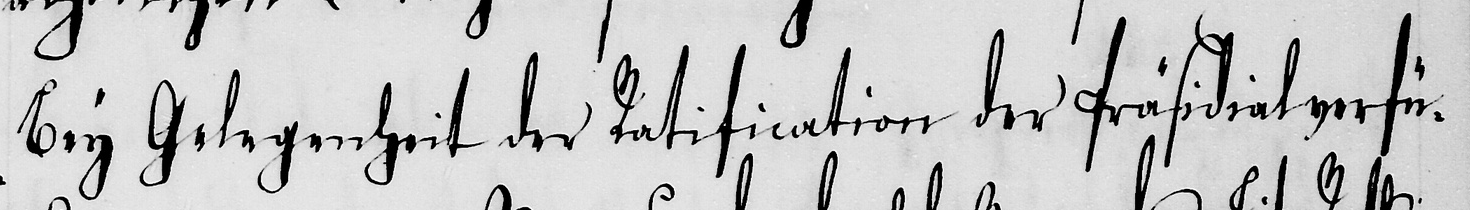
Bey Gelegenheit der Ratification der Präsidialverfü¬
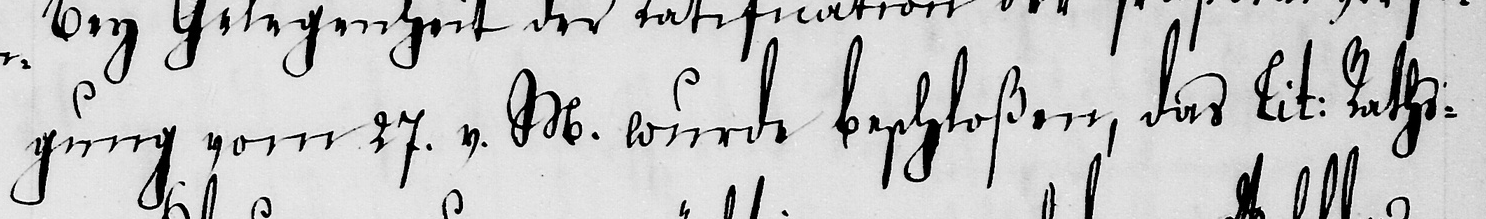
gung vom 27. v. M. wurde beschloßen, das Lit: Raths¬
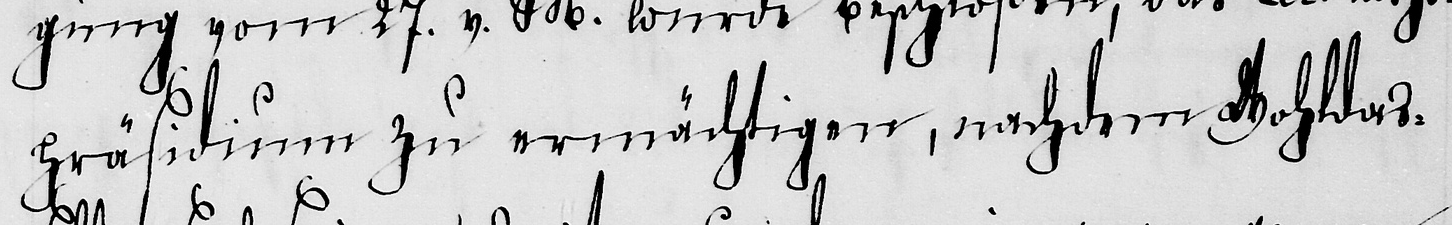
präsidium zu ermächtigen, nachdem Wohldas¬
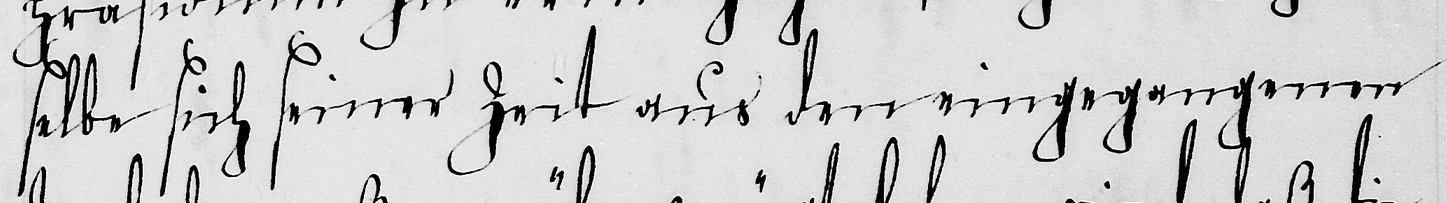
selbe sich seiner Zeit aus den eingegangenen
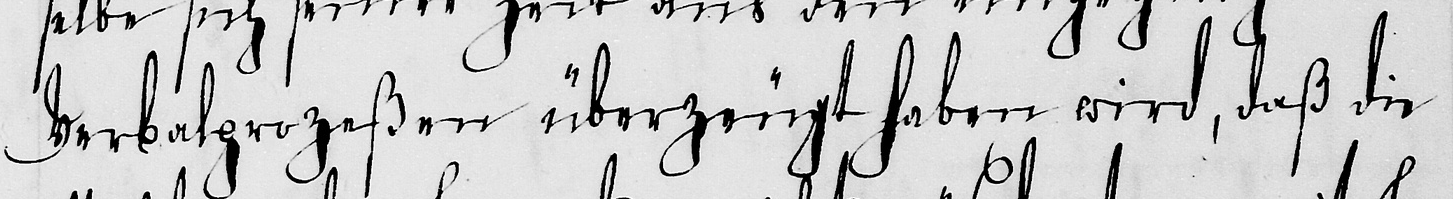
Verbalprozeßen überzeugt haben wird, daß die
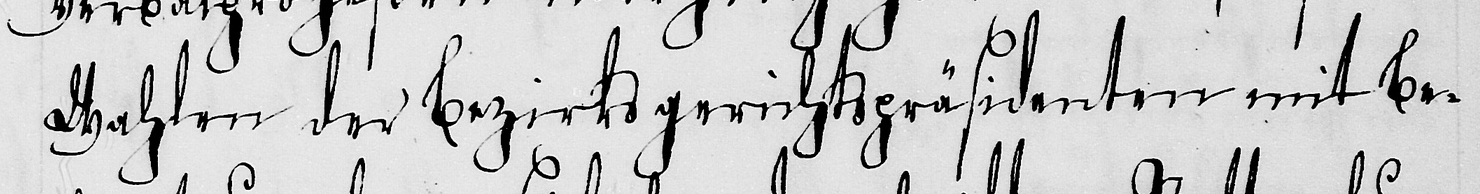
Wahlen der Bezirksgerichtspräsidenten mit Be¬
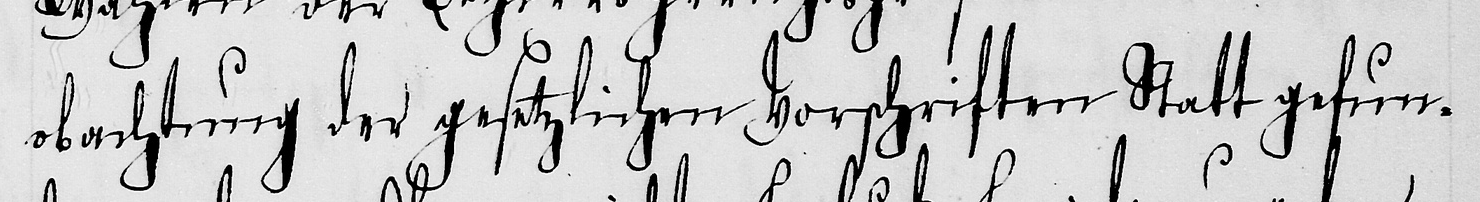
obachtung der gesetzlichen Vorschriften Statt gefun¬
